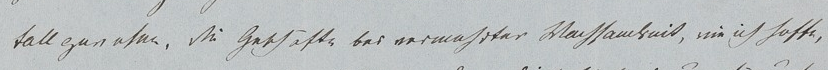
Fall gewesen, die Geschäfte bei vermehrter Wachsamkeit, wie ich hoffe,
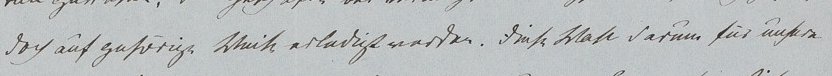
doch auf gehörige Weise erledigt werden. Diese Wahl darum für unsere
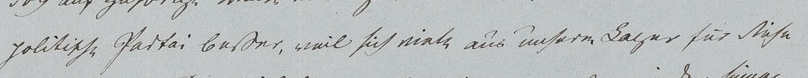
politische Partei beßer, weil sich viele aus unserm Lager für diese
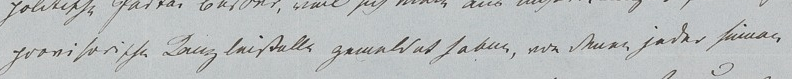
provisorische Kanzleistelle gemeldet haben, von denen jeder seinen
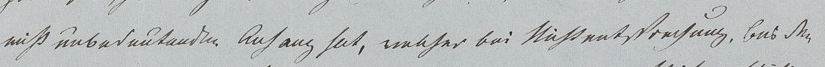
nicht unbedeutenden Anhang hat, welcher bei Nichtentsprechung, bei den
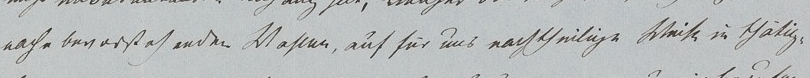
nahe bevorstehenden Wahlen, auf für uns nachtheilige Weise in Thätig-
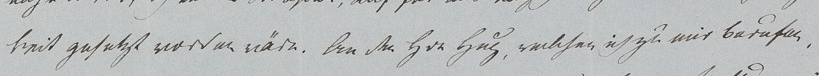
keit gesetzt worden wäre. An den Hrn Hug, welchen ich zu mir berufen,
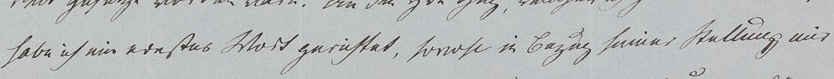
habe ich ein ernstes Wort gerichtet, sowohl in Bezug seiner Stellung mir
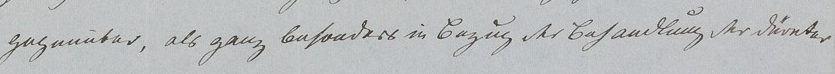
gegenüber, als ganz besonders in Bezug der Behandlung der Dürnter
